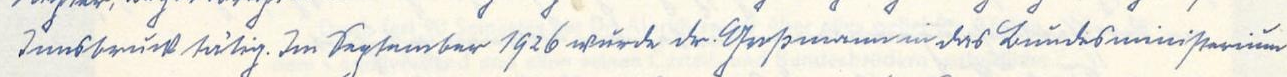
Innsbruck tätig. Im September 1926 wurde Dr. Großmann in das Bundesministerium
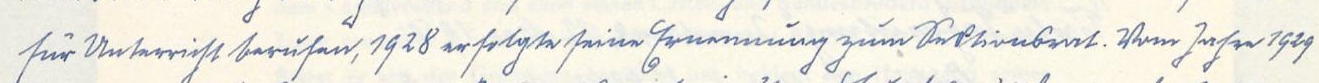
für Unterricht berufen, 1928 erfolgte seine Ernennung zum Sektionsrat. Vom Jahre 1929
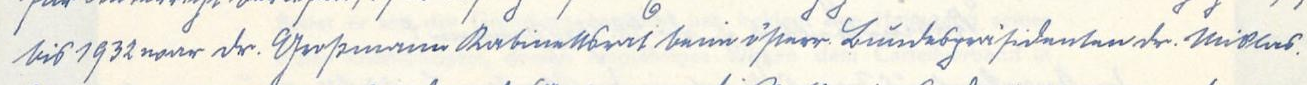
bis 1932 war Dr. Großmann Kabinettsrat beim österreichischen Bundespräsidenten Dr. Miklas.
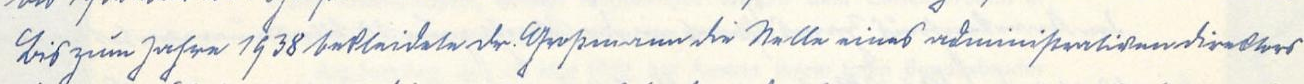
Bis zum Jahre 1938 bekleidete Dr. Großmann die Stelle eines administrativen Direktors
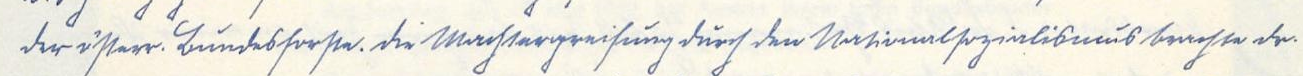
der österr. Bundesforste. Die Machtergreifung durch den Nationalsozialismus brachte Dr.
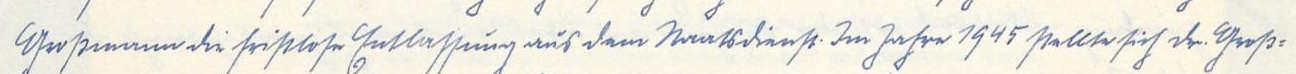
Großmann die fristlose Entlassung aus dem Staatsdienst. Im Jahre 1945 stellte sich Dr. Groß-
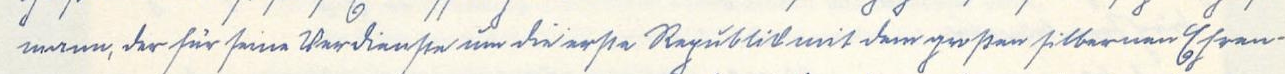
mann, der für seine Verdienste um die erste Republik mit dem großen silbernen Ehren-
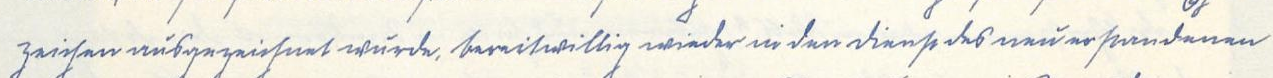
zeichen ausgezeichnet wurde, bereitwillig wieder in den Dienst des neu erstandenen
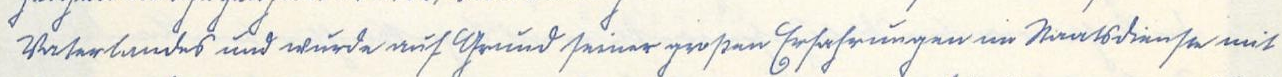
Vaterlandes und wurde auf Grund seiner großen Erfahrungen im Staatsdienste mit
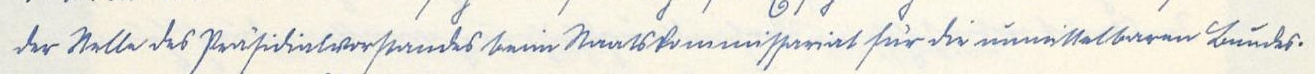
der Stelle des Präsidialvorstandes beim Staatskommissariat für die unmittelbaren Bundes-
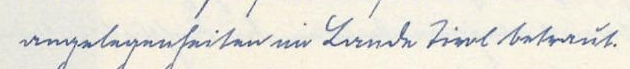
angelegenheiten des Landes Tirol betraut.
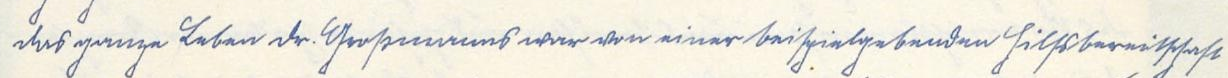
Das ganze Leben Dr. Großmanns war von einer beispielgebenden Hilfsbereitschaft
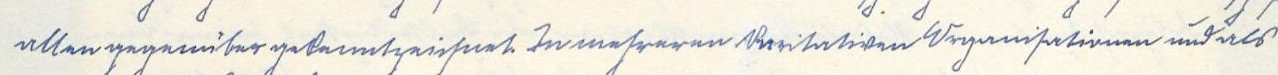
allen gegenüber gekennzeichnet. In mehreren karitativen Organisationen und als
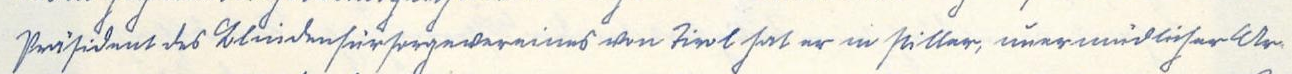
Präsident des Blinden Fürsorgevereins von Tirol hat er in stiller, unermüdlicher Ar-
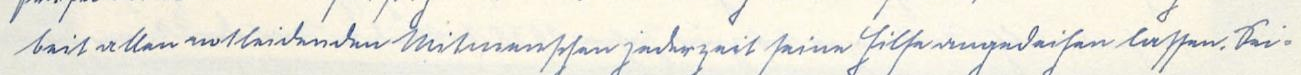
beit allen Not leidenden Mitmenschen jederzeit seine Hilfe angedeihen lassen. Sei-
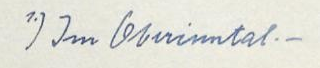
1) Im Oberinntal.-
